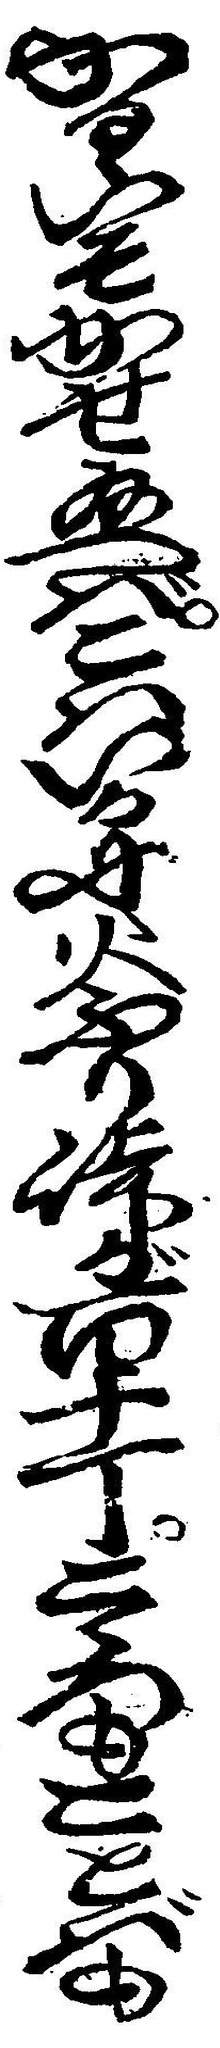かるゝいそかせ給へば。こはいかに火ふり峠が百十丁。こゝろもことばも
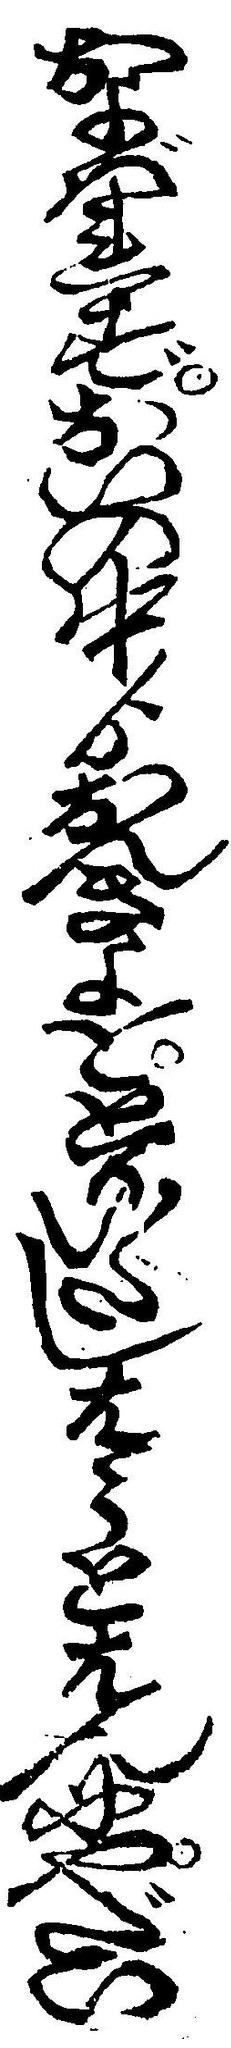およばれず。おいの中ゟおんきよを。とりいたしはうとはんにや。だい
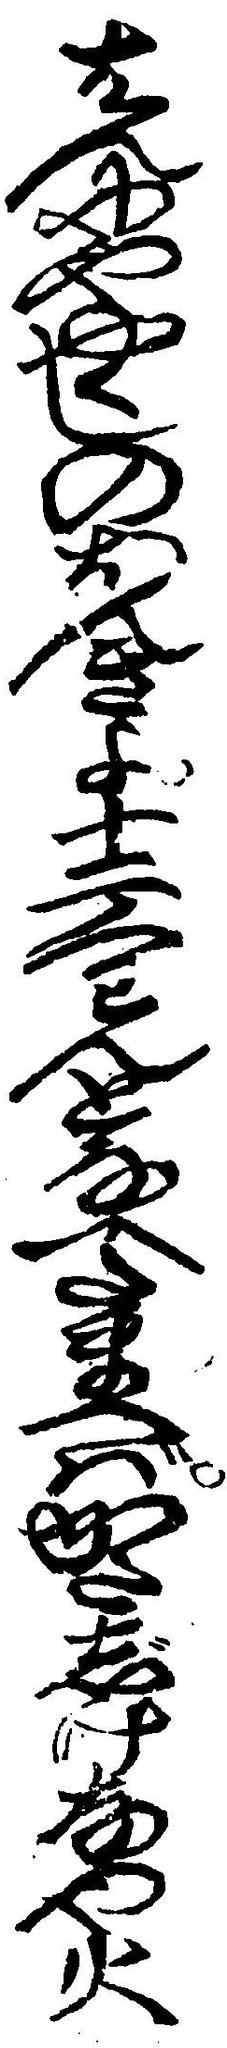はんにややくしのおんきよ。十二くわんとなへたまへば。かたじけなや火
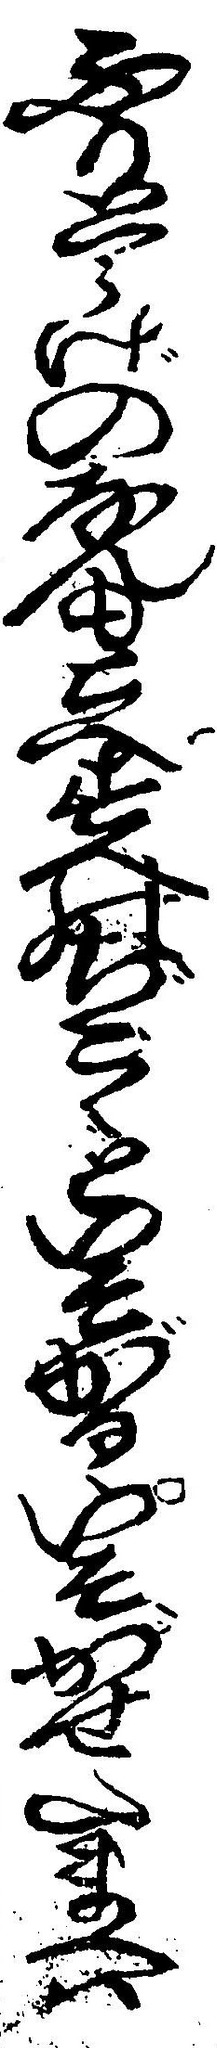ふりとうげのなんもこへ。すへのちこくといそがるゝ。いそがせたまへは

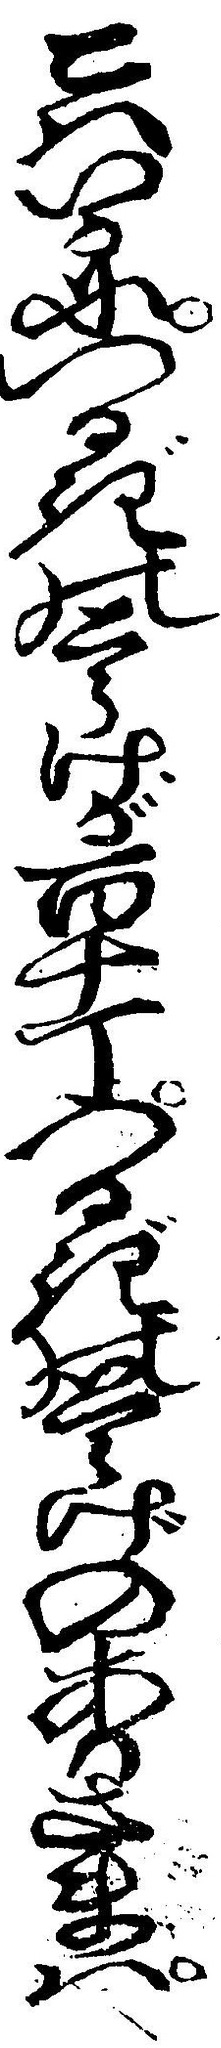こはいかに。つるぎのとうげが百十丁。つるぎのとうげのありさまは。
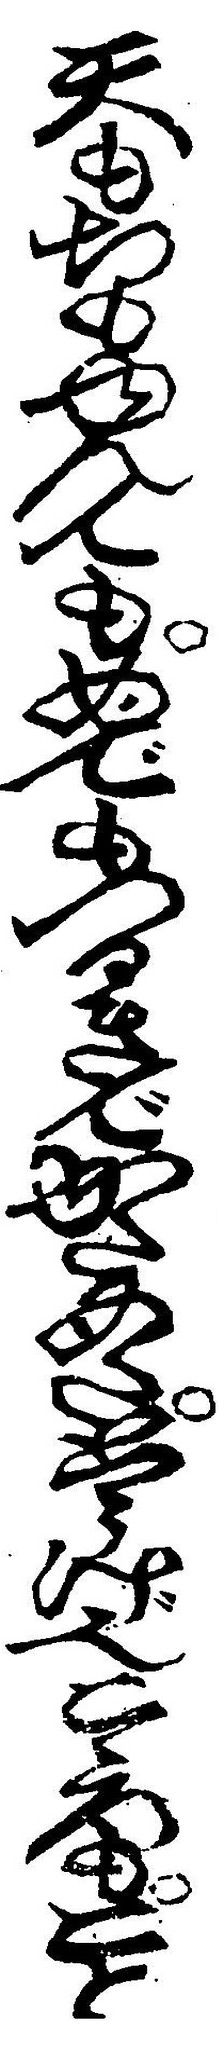天もちもゆんても。めでもつるきでかためた。とうげ也。こゝろもこと
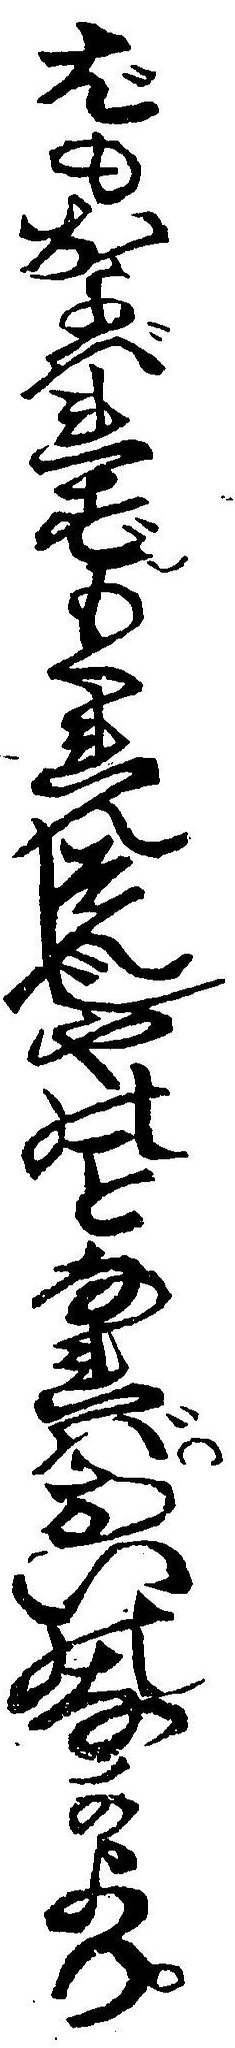ばもおよばれず。もくれんそんじやのことなれば。おいのなかより。
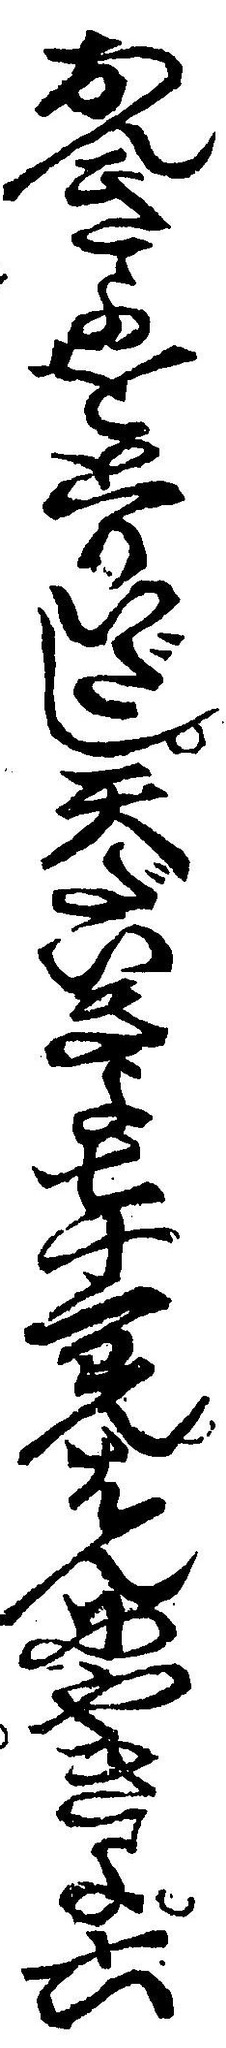おんきよをとりいだし。天だいきよ七十くわん。はんにやきよ。六
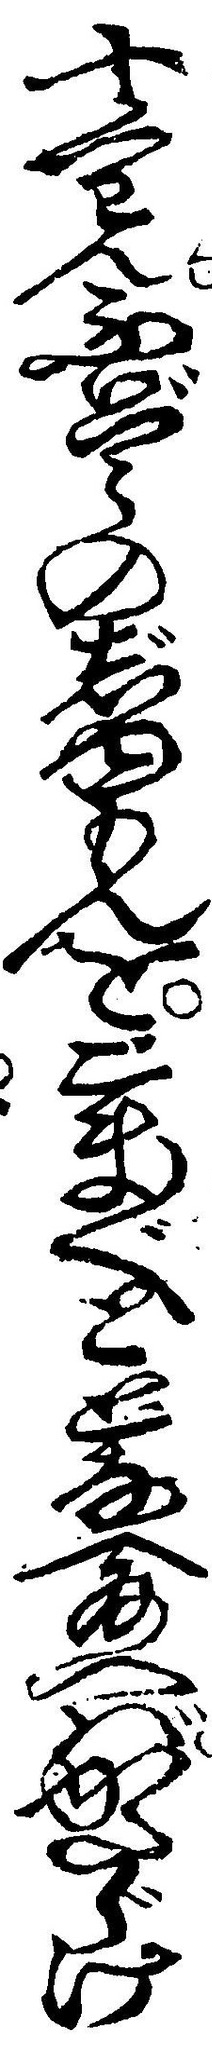十くわん。ふどうのじゆもんを。こま〴〵ととなへ給へば。かたじけ
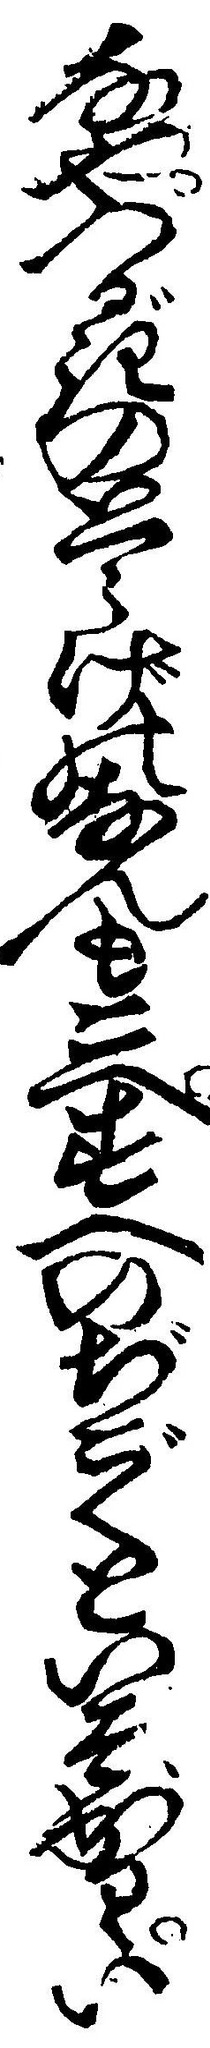なや。つるぎのとうげのなんもこへ。すへのぢごくといそかるゝ。い
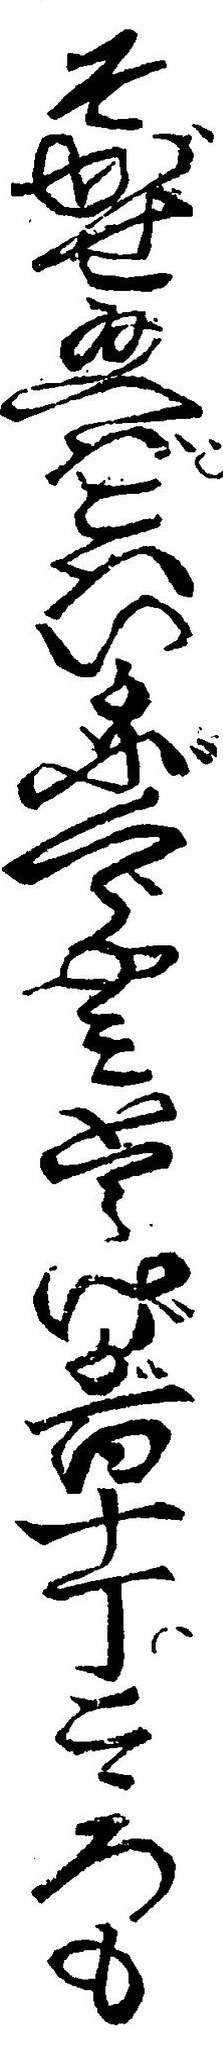そがせ給へば。こはいかに。くらやみとうげが百十丁。こゝろも
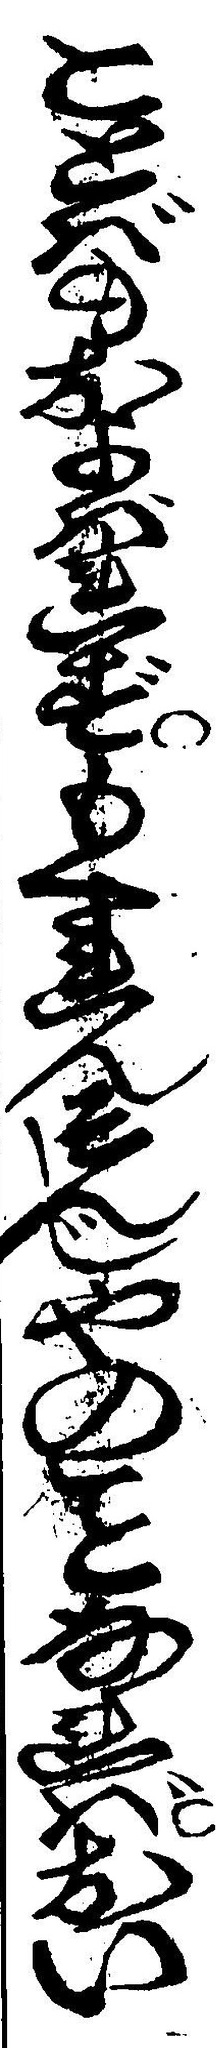ことばもおよばれず。もくれんそんじやのことなれば。おい
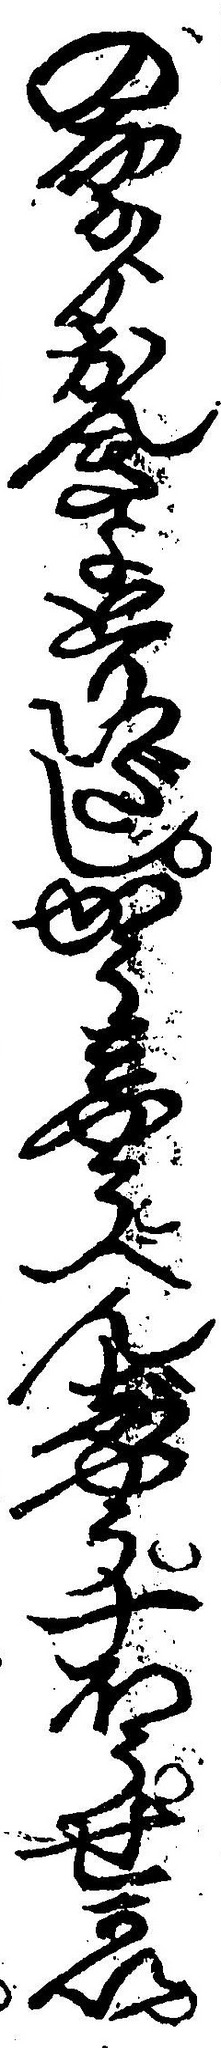のなかゟおんきよとりいだし。かうみやう。へんじやう。十ほう。せかい。
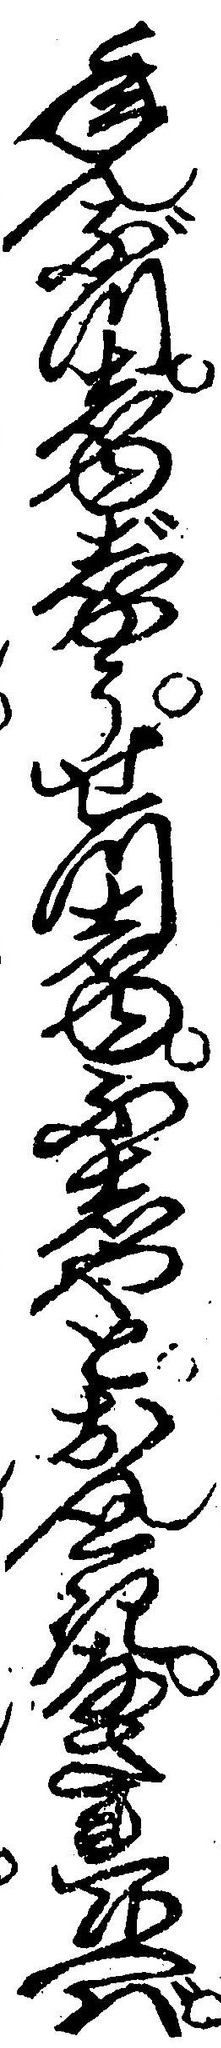ねんぶつ。しゆじやう。せつしゆ。ふしやとおんとき。なされ候へば。
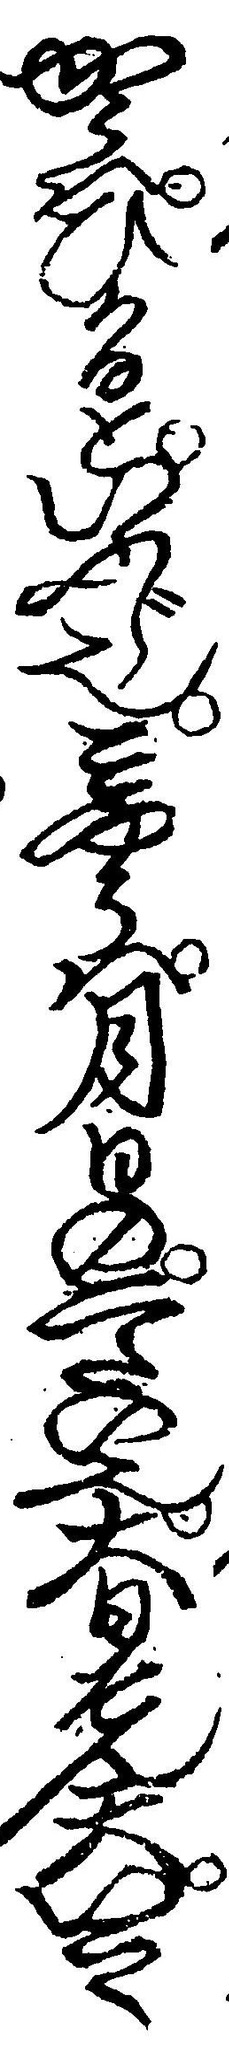かうは。ひかると。いふじ也。みやうは。月日の二たい也。大日そん天。いとく
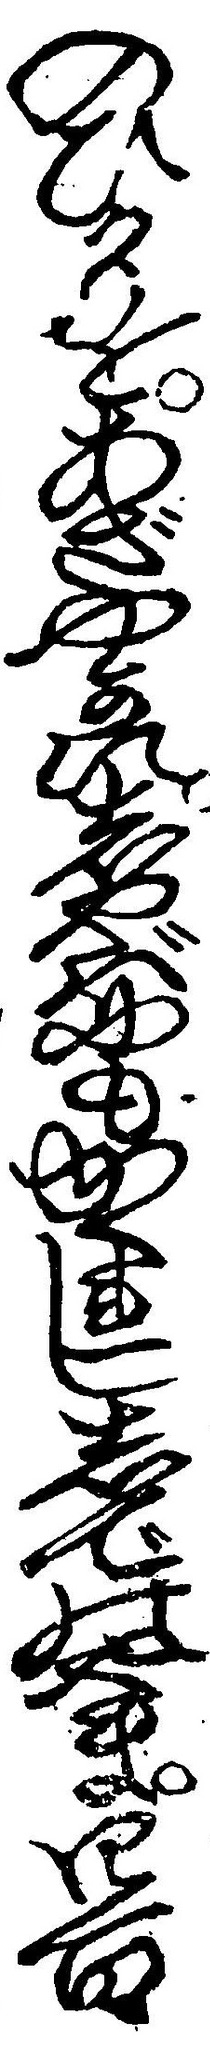のひかりを。あざやかに。しやばにもかくれししでのやま。四百
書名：目連尊者地獄めくり / 宇留藤太夫正本
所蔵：東京大学総合図書館 General Library in the University of Tokyo, JAPAN
